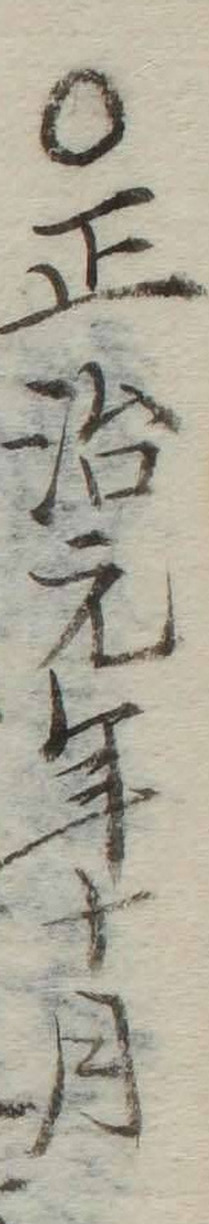〇正治元年十月
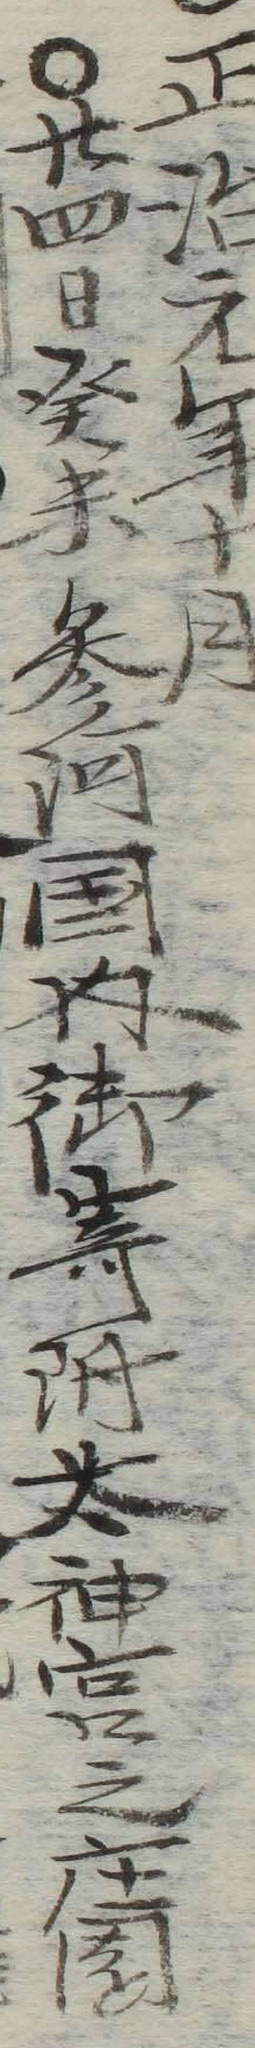〇廿四日癸未参河国内御寄附太神宮之庄園
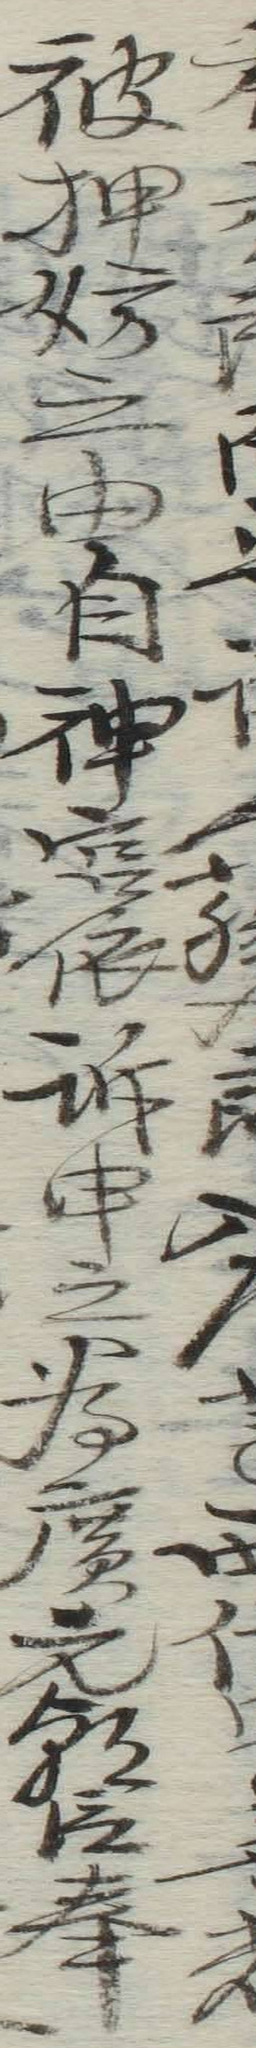被押妨之由自神宮依訴申之為廣元朝旨奉
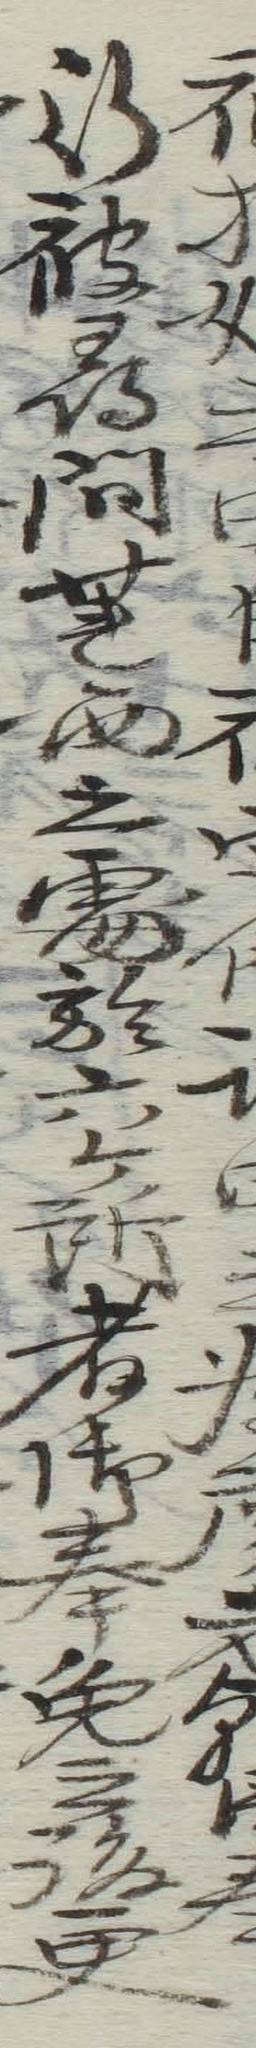行被尋間蓮西之処於六ケ所者御奉免之後更
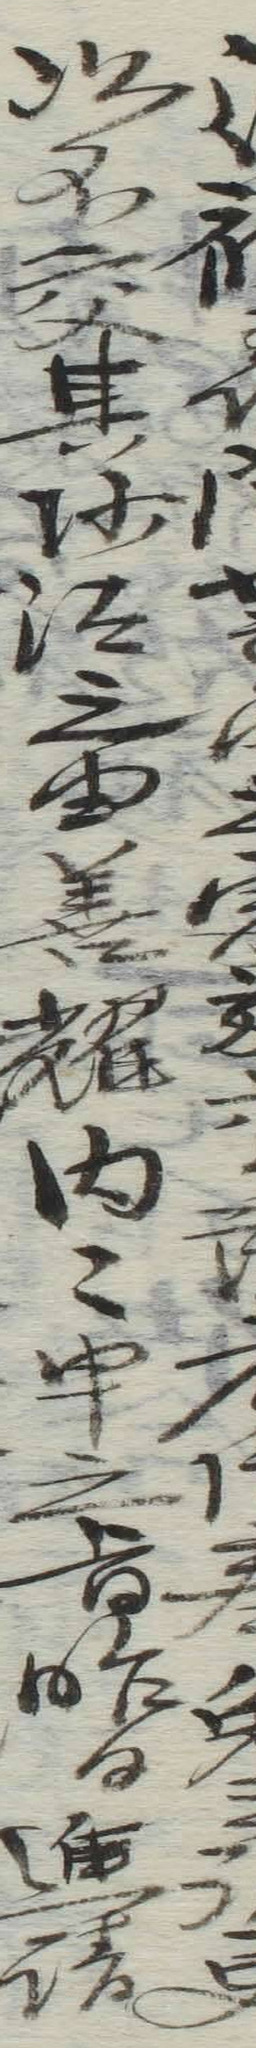以不交其沙汰之由善耀内々申立旨昨日進請
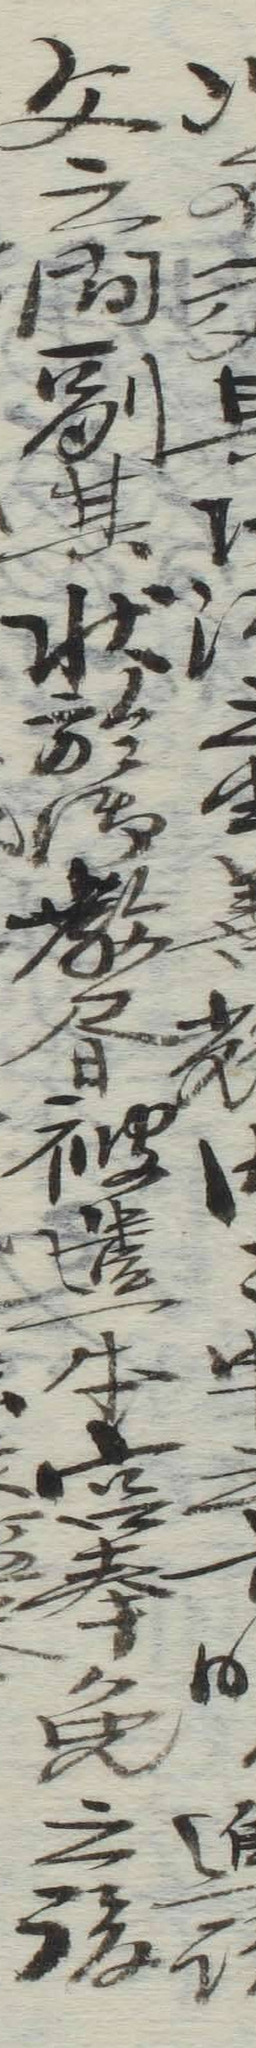文之間割其状於御教昼被遣本宮奉免之後
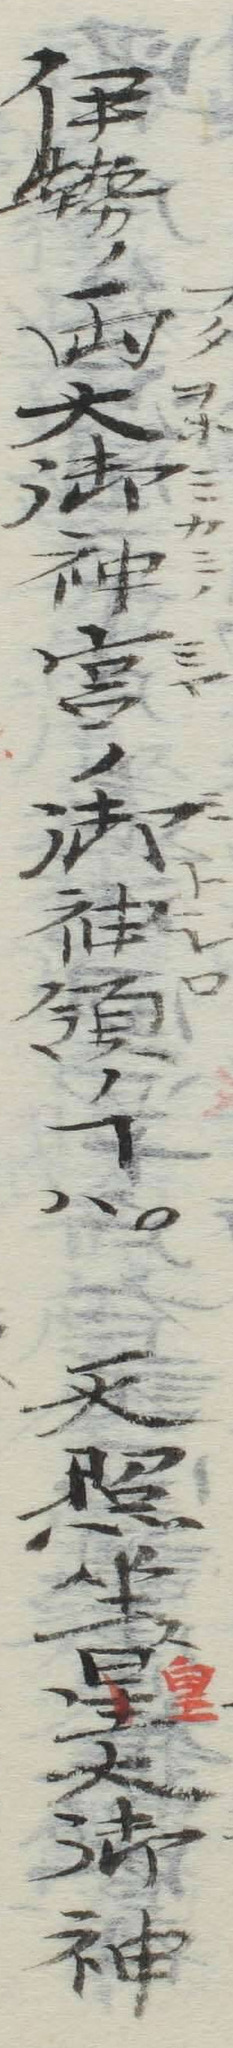伊勢ノ両大御神宮ノ御神領ノコトヿハ。天照坐ス皇大御神
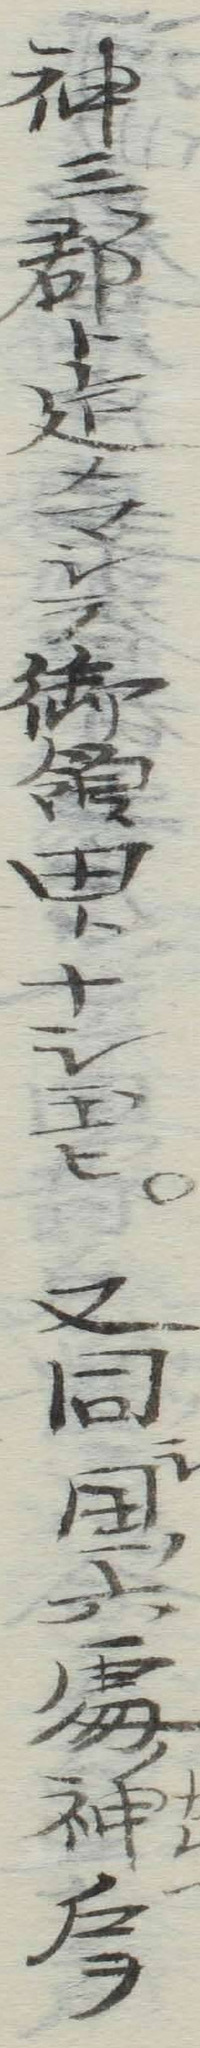神三郡ト定メマシテ御領田トナシ玉ヒ。又同シ国ノ六處ノ神戸ヲ
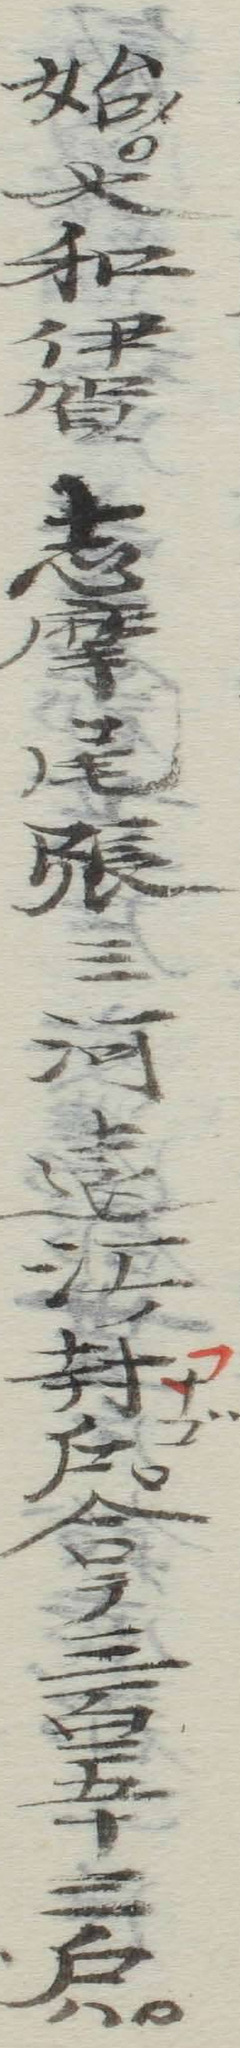始メ。大和伊賀志摩尾張三河遠江ノ封戸。合テ三百五十三戸ハ。
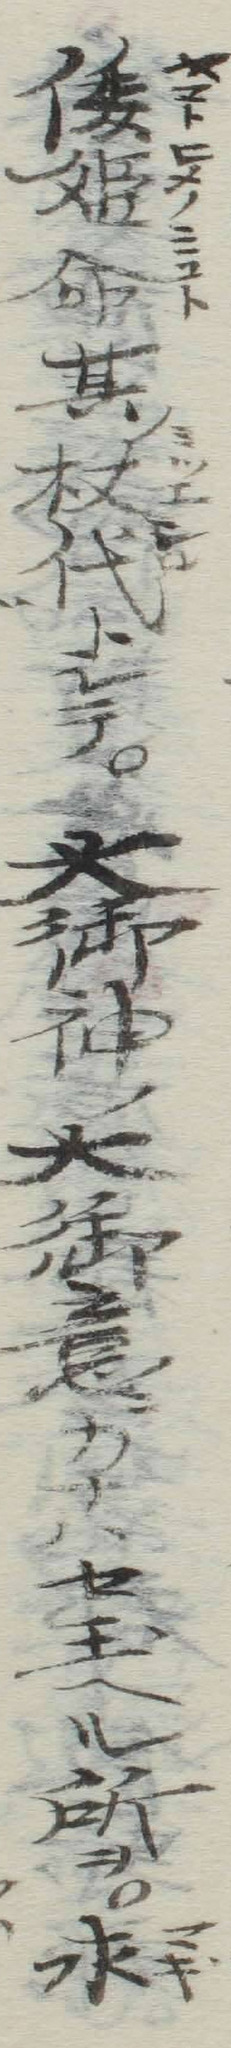倭姫命其ノ杖代トシテ。大御神ノ大御意ニカナハセ玉ヘル所ヲ。求

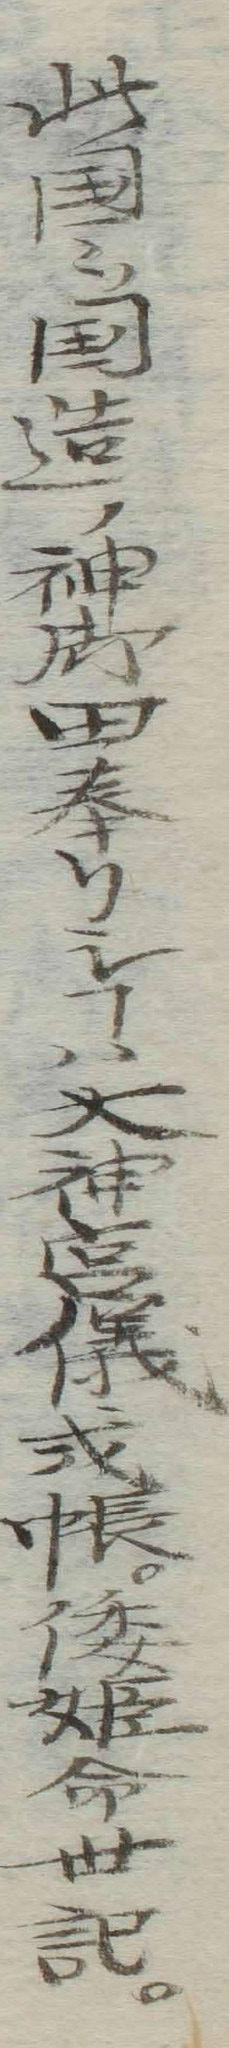此国々国造神御田奉リシコトハ大神宮儀式帳。倭姫命世紀。
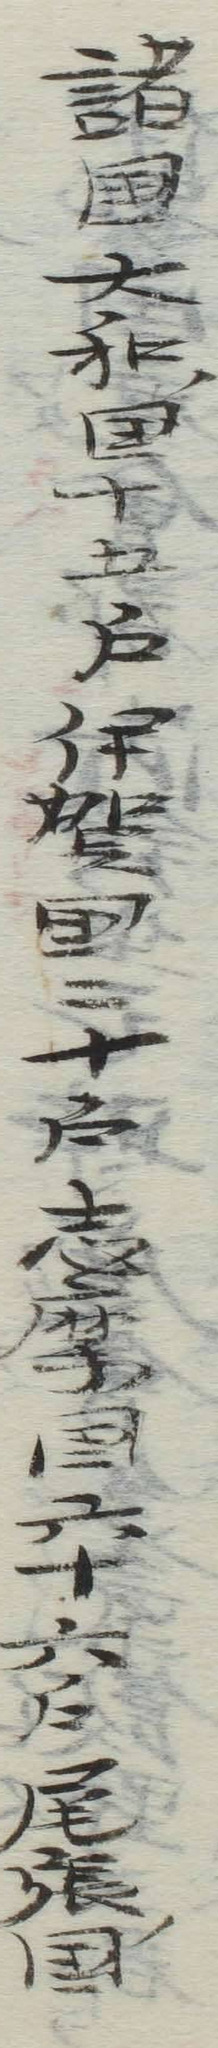諸国大和国十五戸伊賀国二十戸志摩国六十六戸尾張国
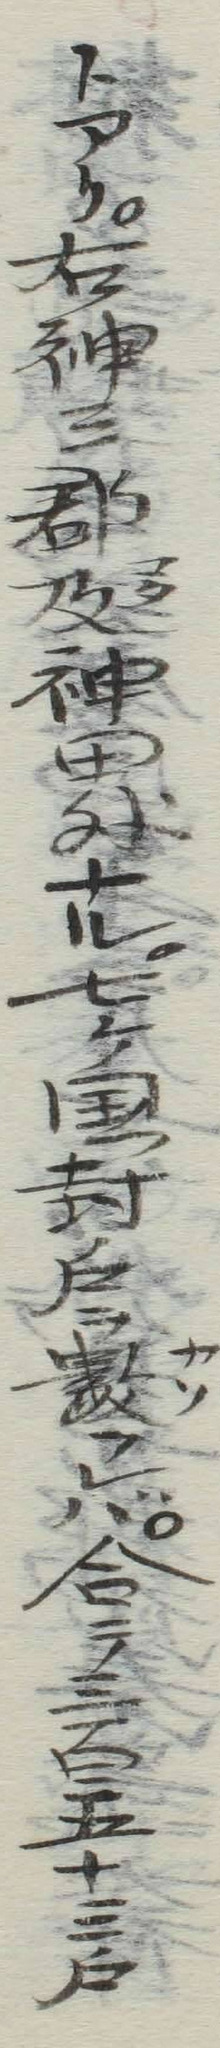トアリ。右神三郡及神田外ナル。七ケ国封戸ヲ数フレバ。合テ三百五十三戸
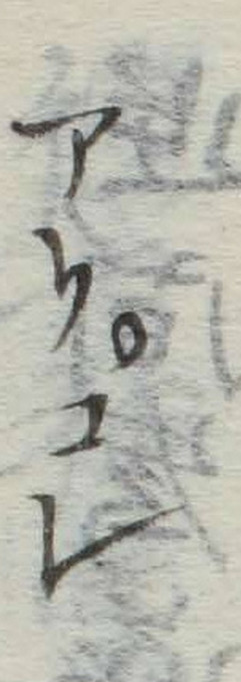アリ。コレ

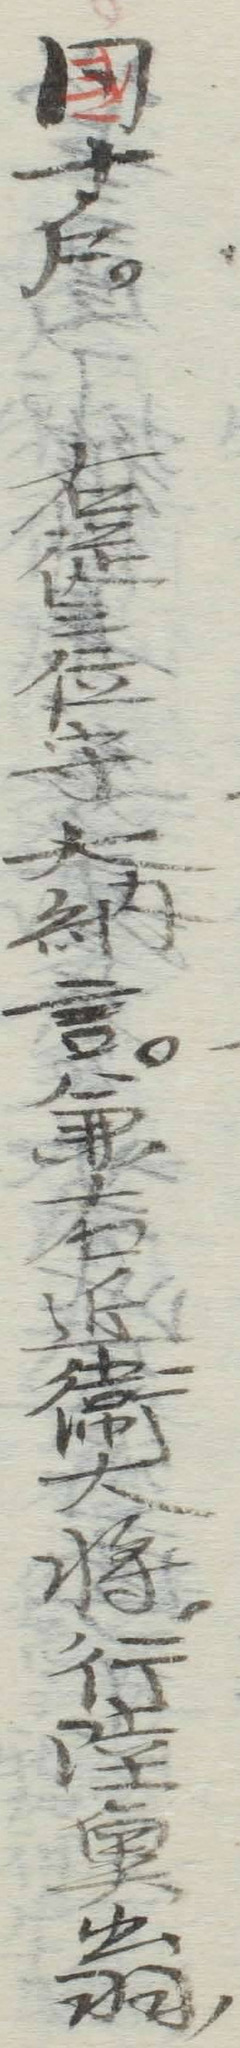国十戸。右従三位守大納言。兼右近衛大将。行陸奥出羽
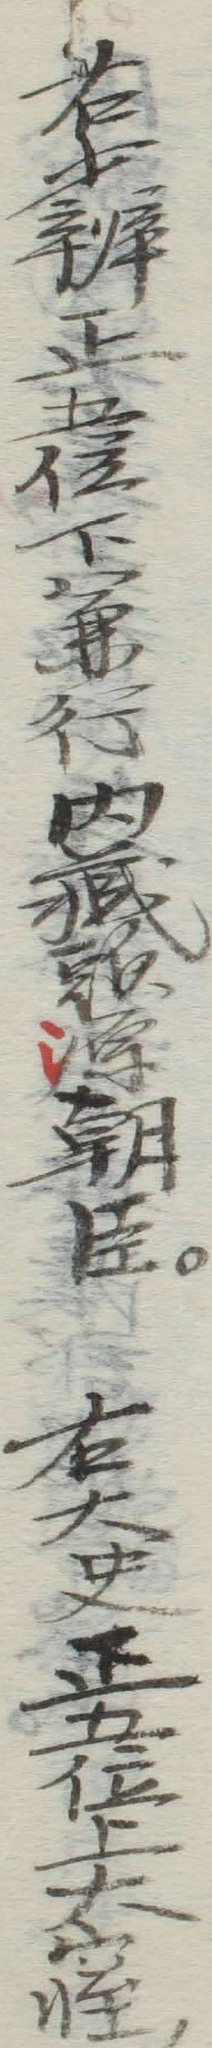右少弁正五位下兼業内蔵頭源朝臣。右大史正五位上大窪
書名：神戸御厨御薗考
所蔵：国文学研究資料館
